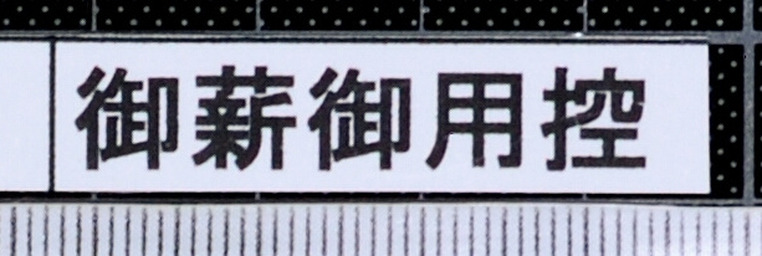御薪御用控
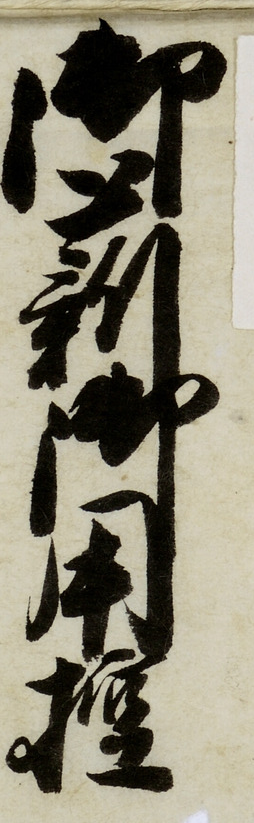御薪御用控
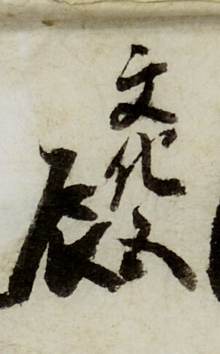文化五
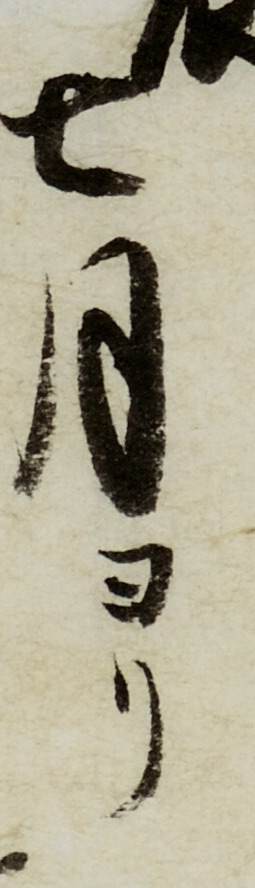七月ヨリ
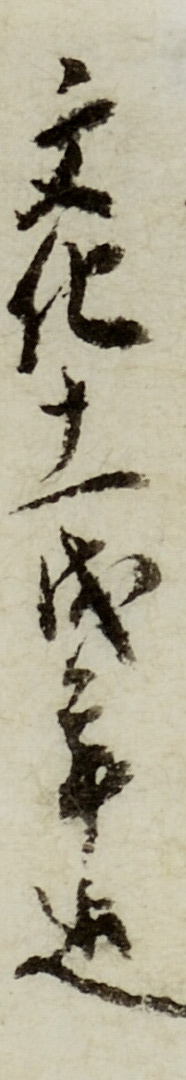文化十一戌年迄
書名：御薪御用控
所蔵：伊那市立高遠町図書館・合同会社AMANE
